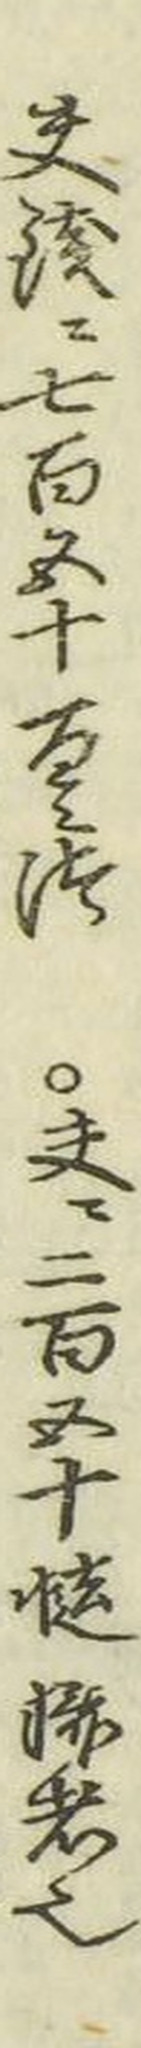夫銭ニ七百五十徒◦夫ニ二百五十慥済者也
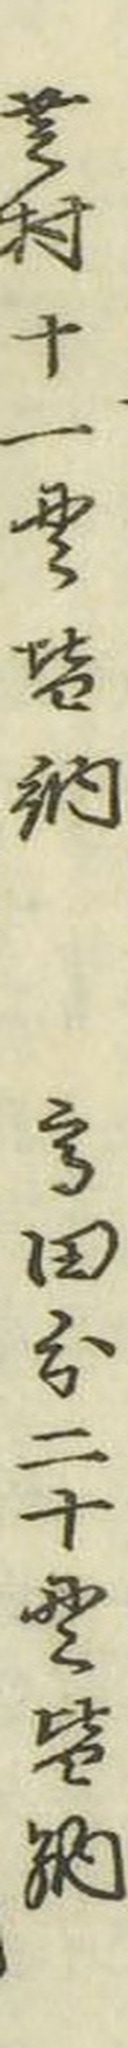芝村十一貫皆納高田分二十貫皆納
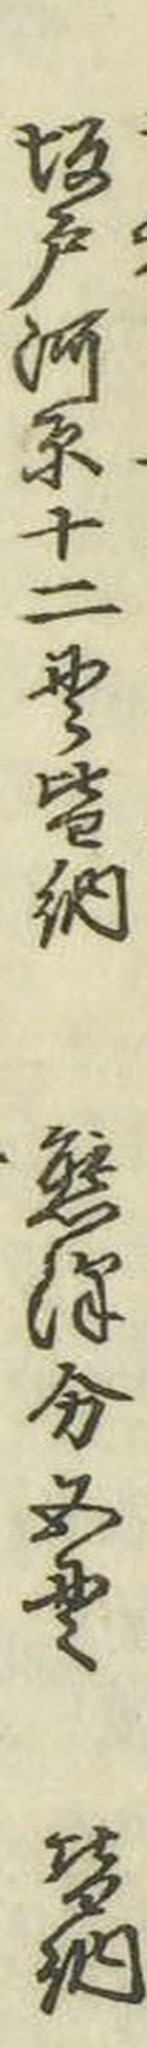坂戸河原十二貫皆納熊澤分五貫皆納
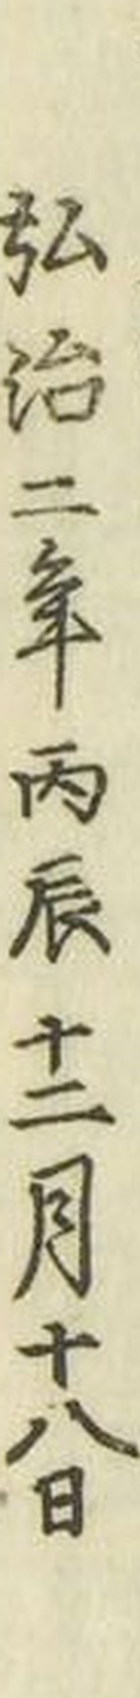弘治二年丙辰十二月十八日
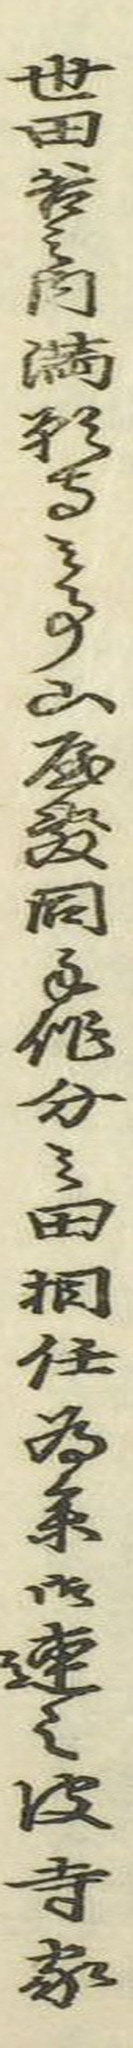世田谷之内滿願寺之事山屋敷同手作分之田相任為参御連之彼寺家
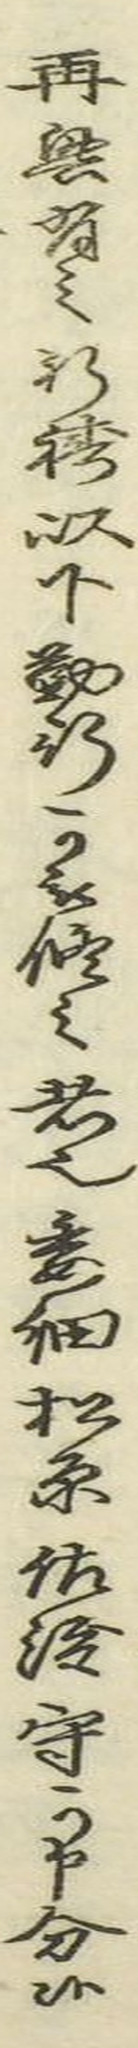再興有之祈禱以下勤行可被修之者也委細松原佐渡守可申分候
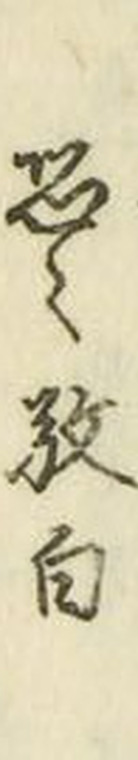恐々敬白
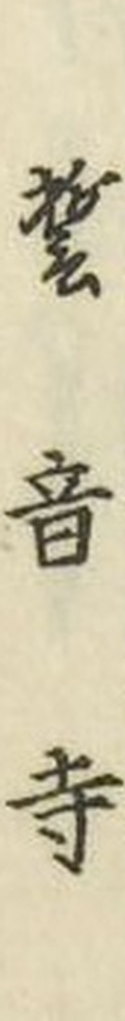誓音寺
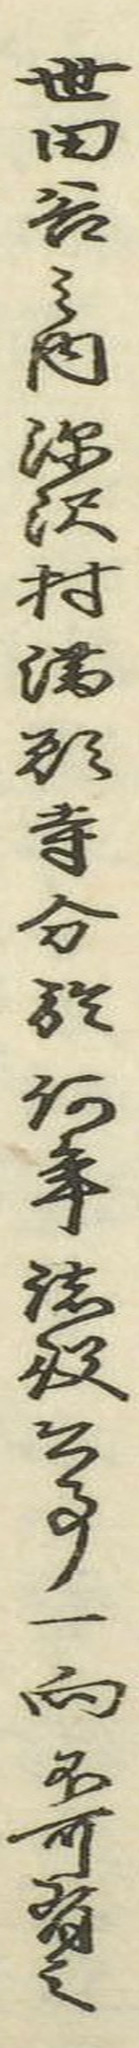世田谷之内深沢村満願寺分於何年諸役公事一向不可有之
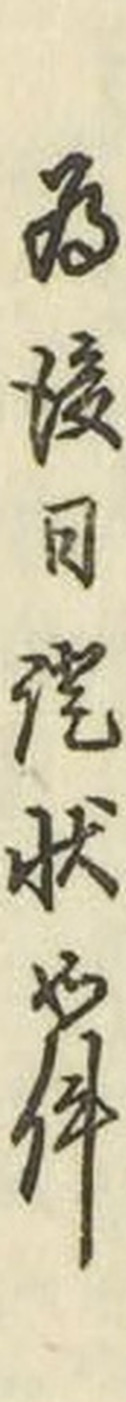為後日證状如件
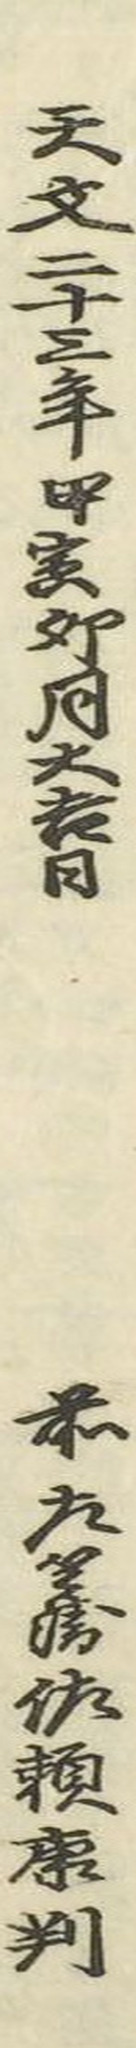天文二十三年甲寅卯月大吉日前左兵衛佐頼康判
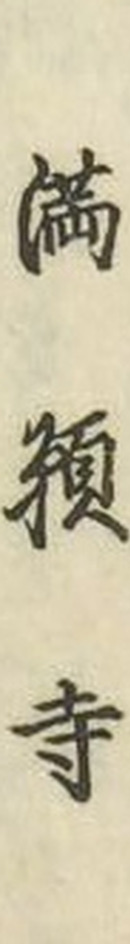満願寺
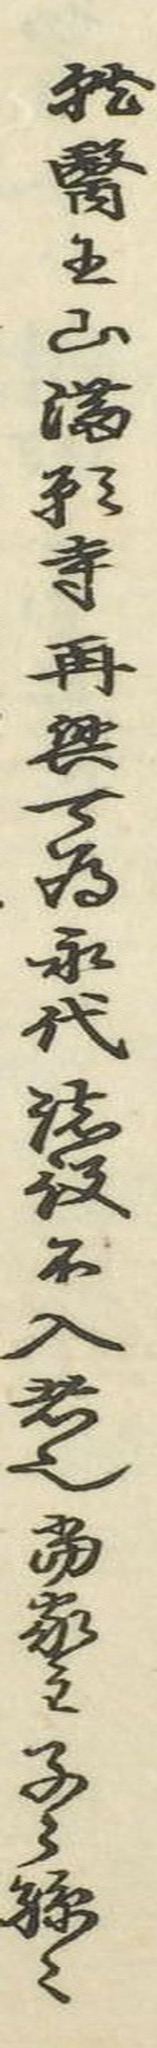就醫王山滿願寺再興可為永代諸役不入者也當家主子々孫々
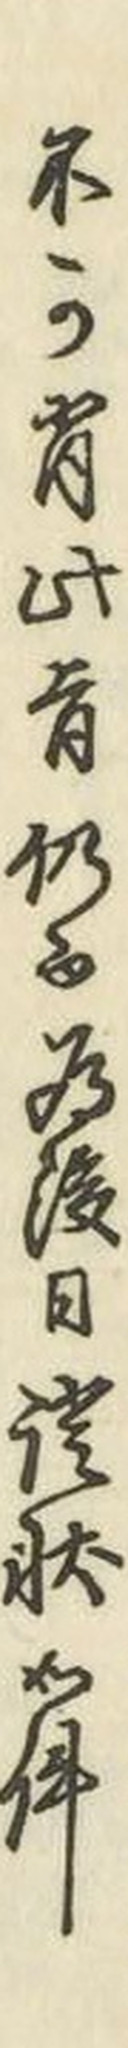不可背此旨仍而為後日證状如件
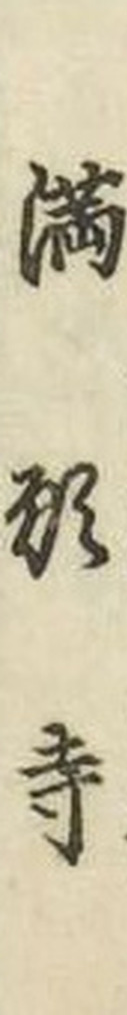満願寺
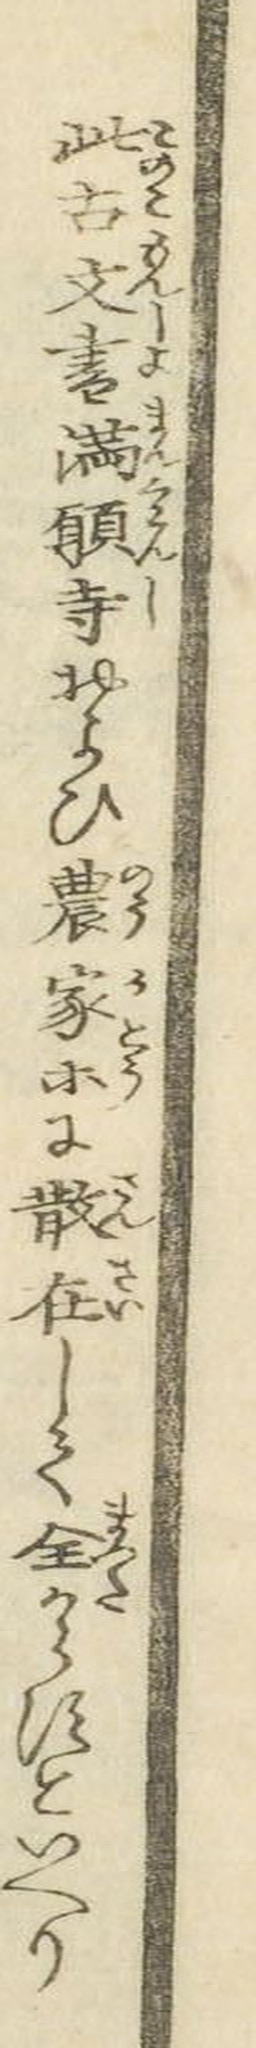此古文書万願寺およひ農家等に散在して全からすといへり
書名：江戸名所図会 20巻 巻之8
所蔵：東京学芸大学教育コンテンツアーカイブ
